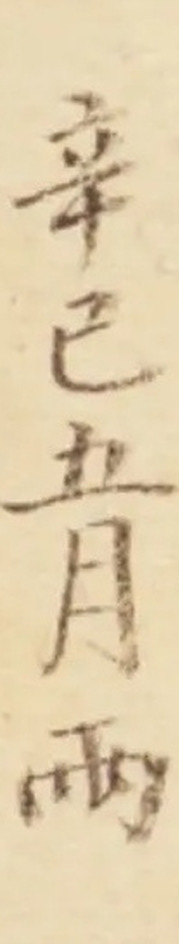辛巳五月而
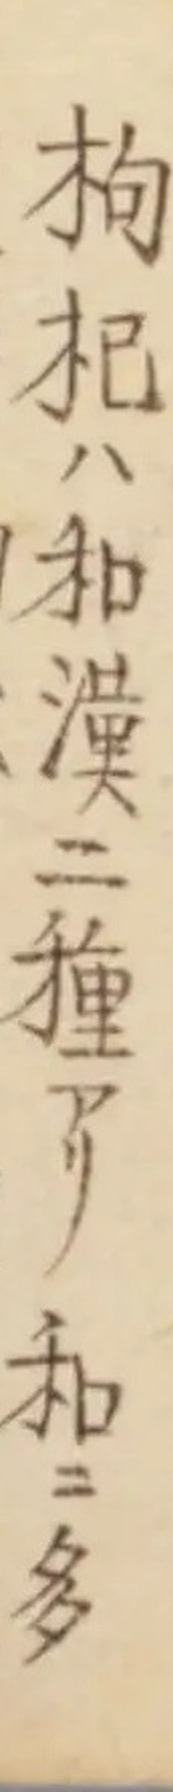枸杞ハ和漢ニ種アリ和ニ多
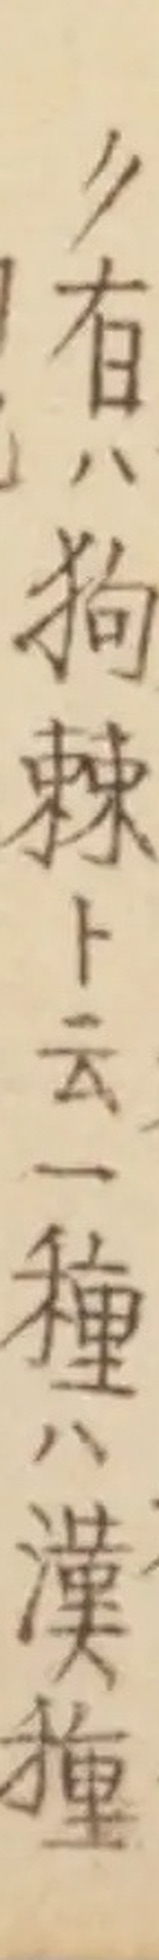ク有ハ枸棘ト云一種ハ漢種
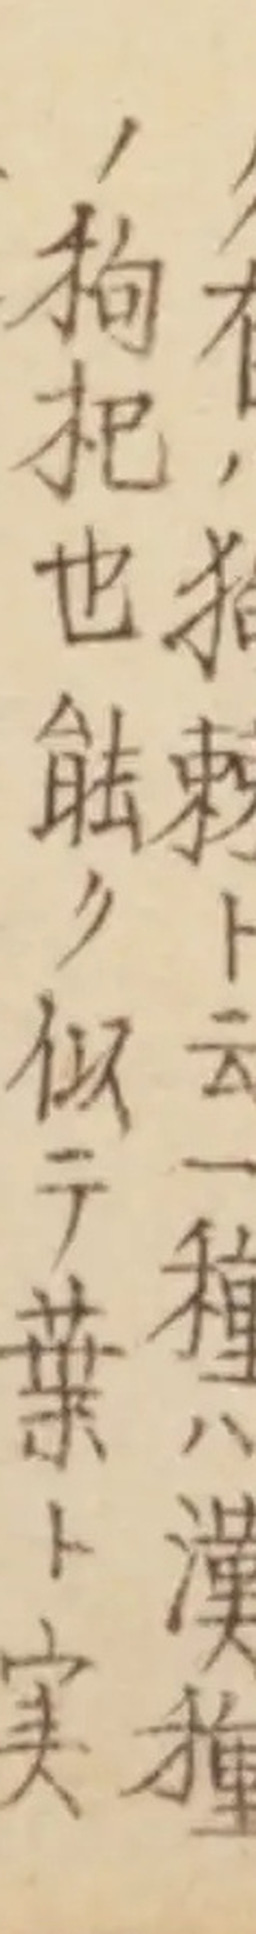ノ枸杞也能ク似テ葉ト実
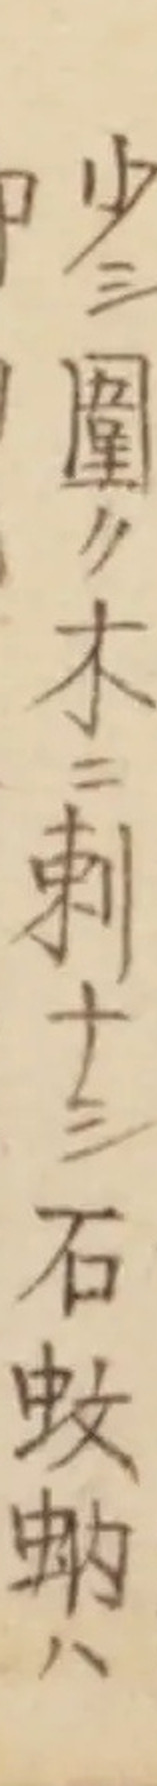少シ圍ク木ニ刺ナシ石蚊蚋ハ
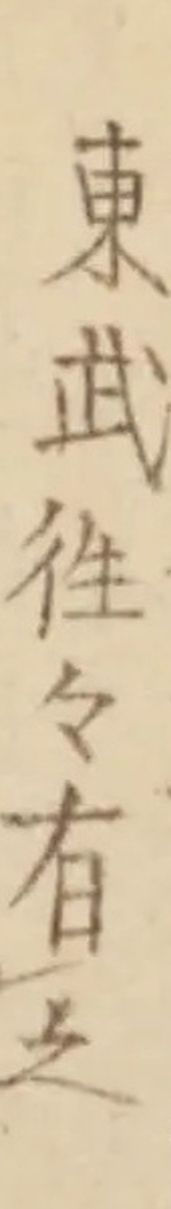東武往々有之
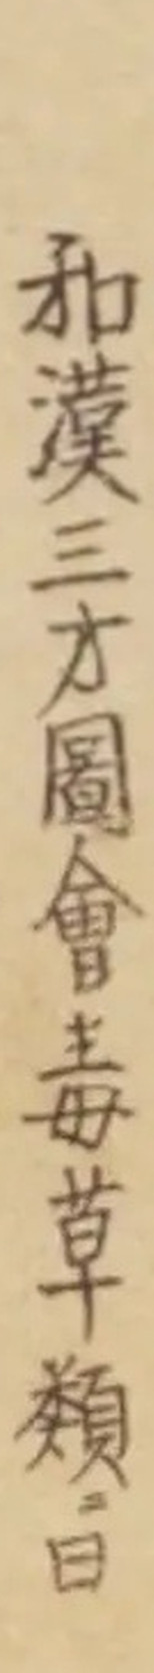和漢三才圖會毒草類に曰
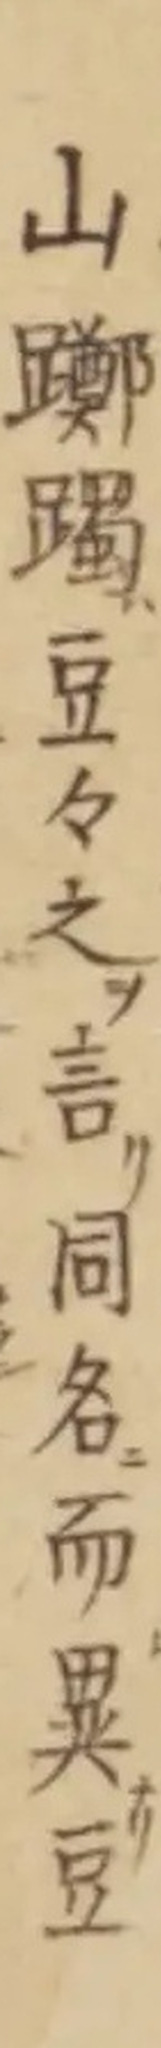山躑躅豆々之ヲ言リ同名ニ而異ナリ豆
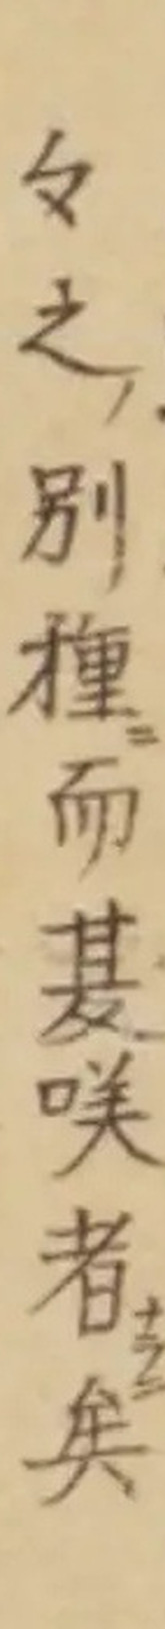々之ノ別種ニ而其咲者ナラン矣

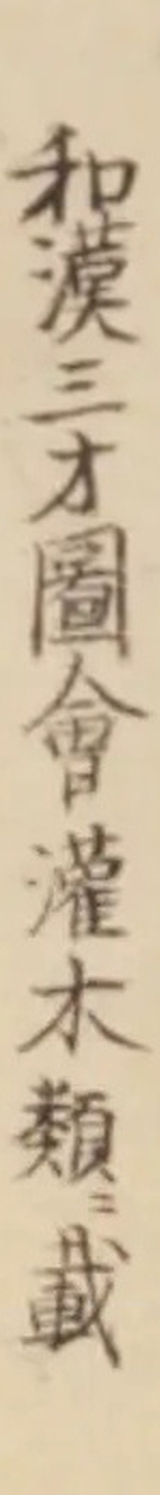和漢三才圖會灌木類にニ載
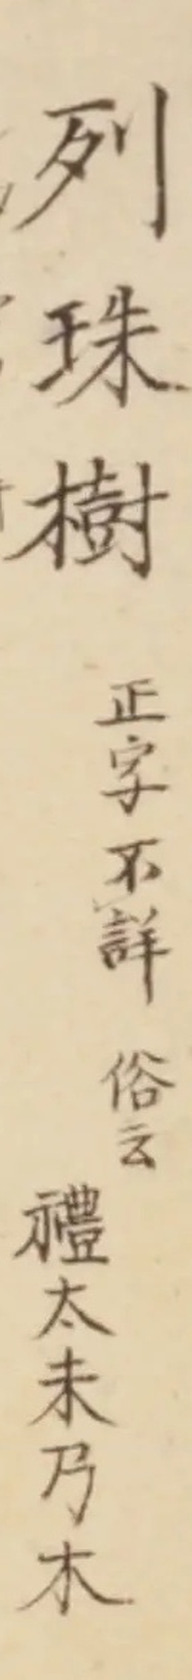列玉木正字不詳俗云禮太未乃木
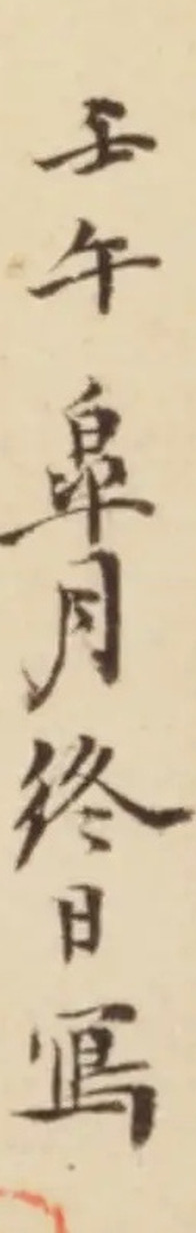壬午皐月終日寫
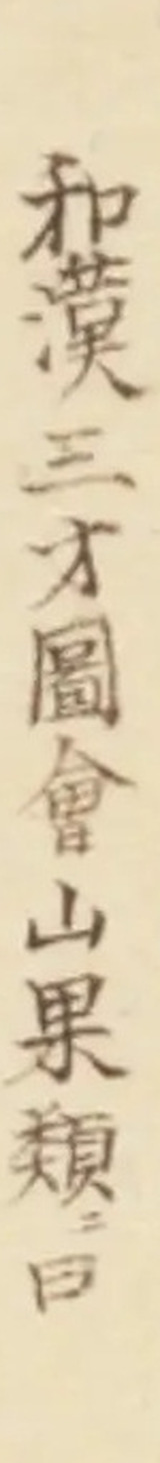和漢三才圖會山果類ニ曰
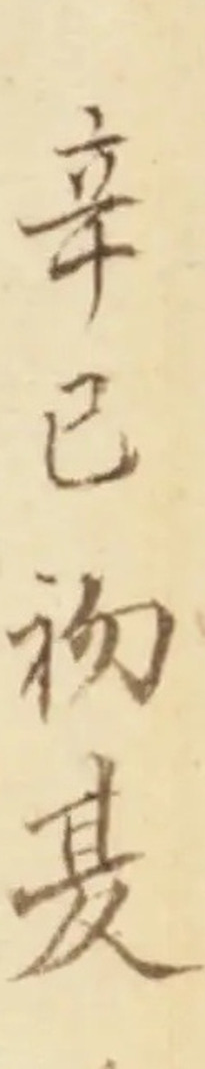辛巳初夏
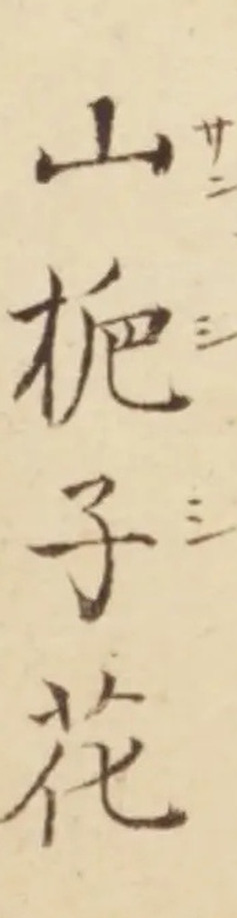山梔子花
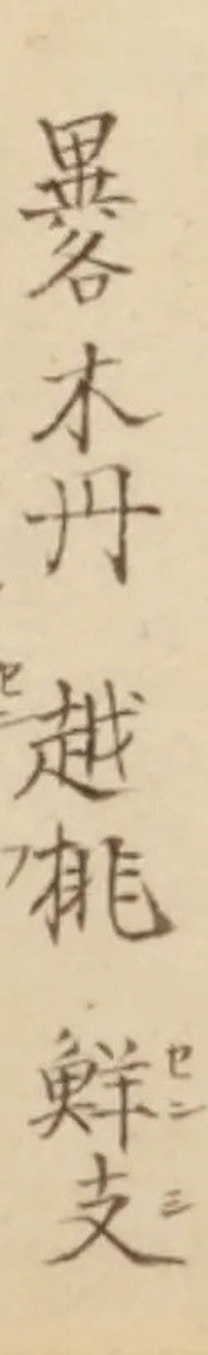異名木丹越棑鮮支
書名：梅園草木花譜夏之部. 1
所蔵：国立国会図書館 National Diet Library, JAPAN
